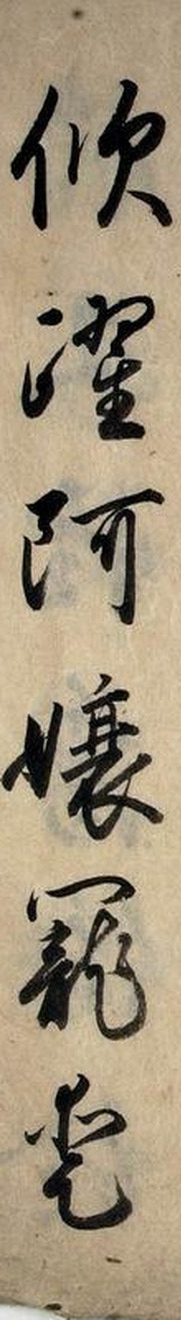欣躍阿嬢寵愛

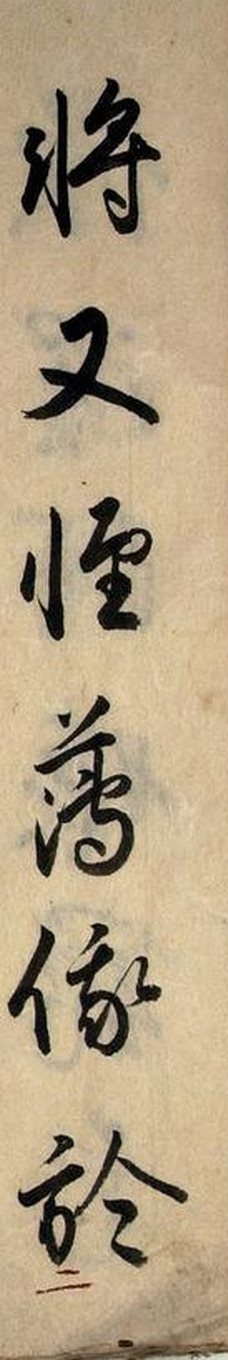将又軽薄俄於
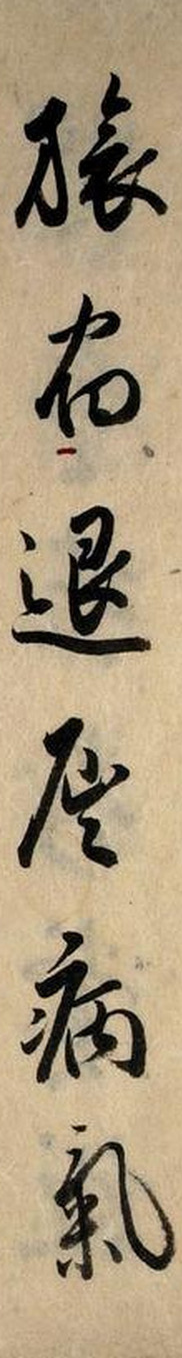旅宿退屈病気
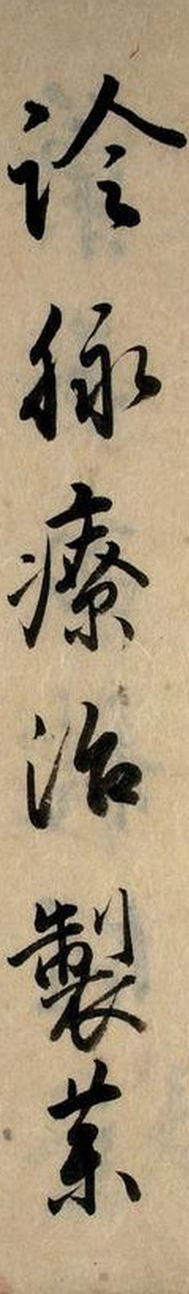診脈療治製薬
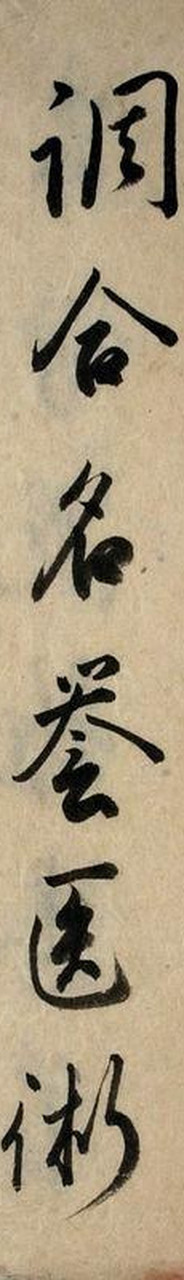調合名誉医術
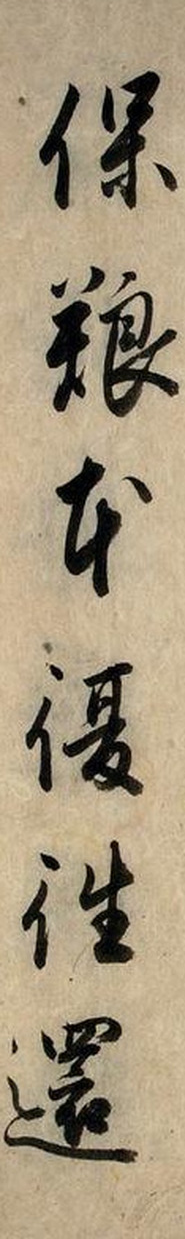保養本復往還

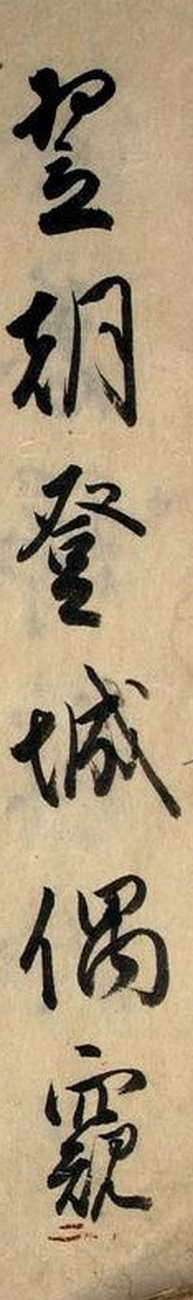翌朝登城偶窺
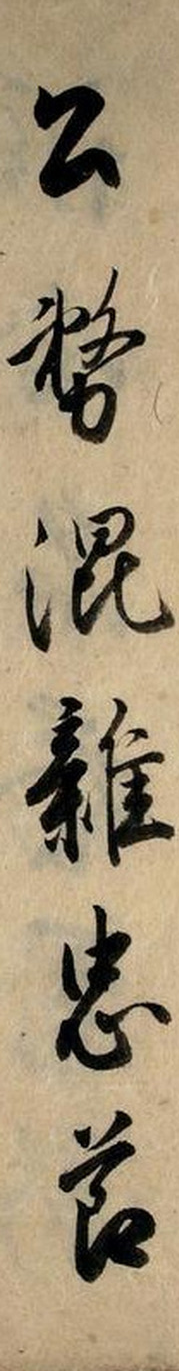公務混雑忠節

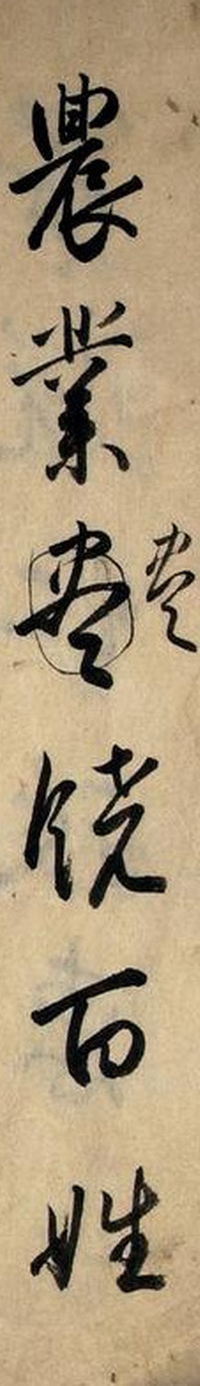農業豊饒百姓
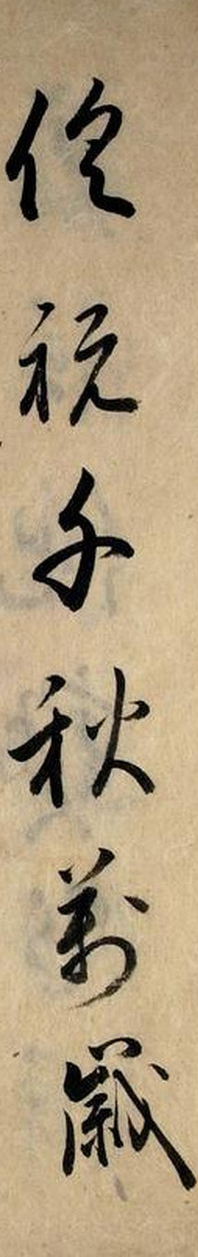倶祝千秋万歳
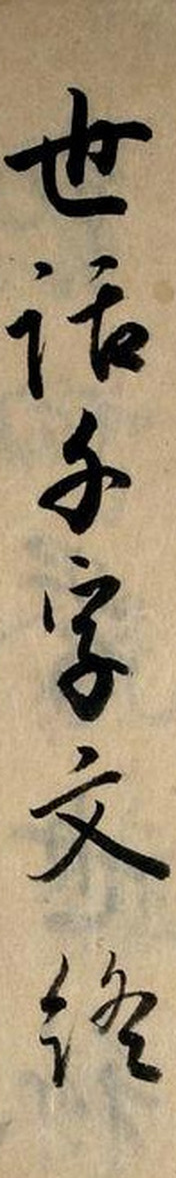世話千字文終
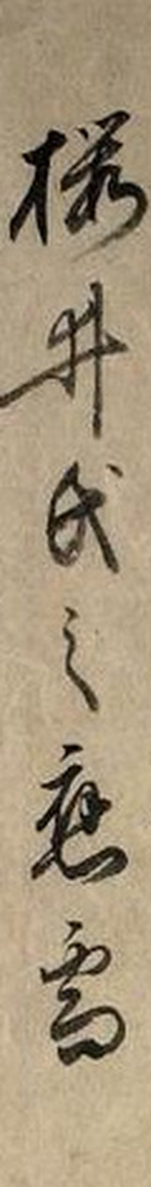桜井氏之応需
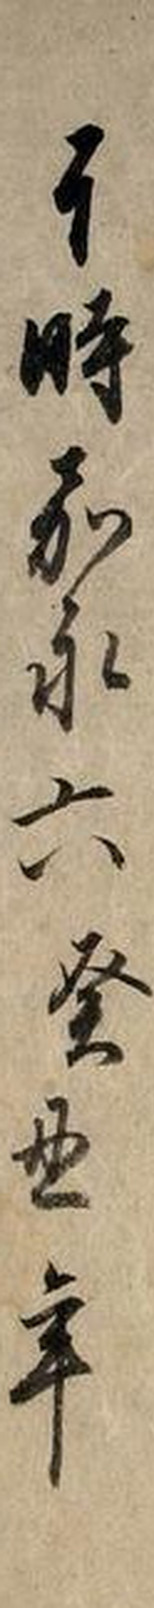于時嘉永六癸丑年
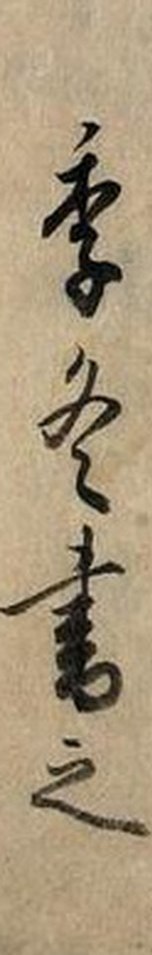季冬書之
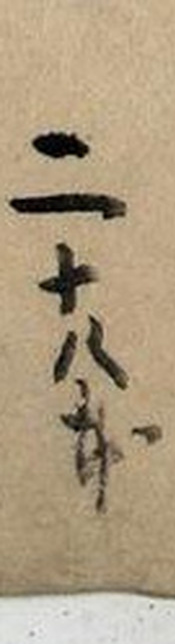二十八本

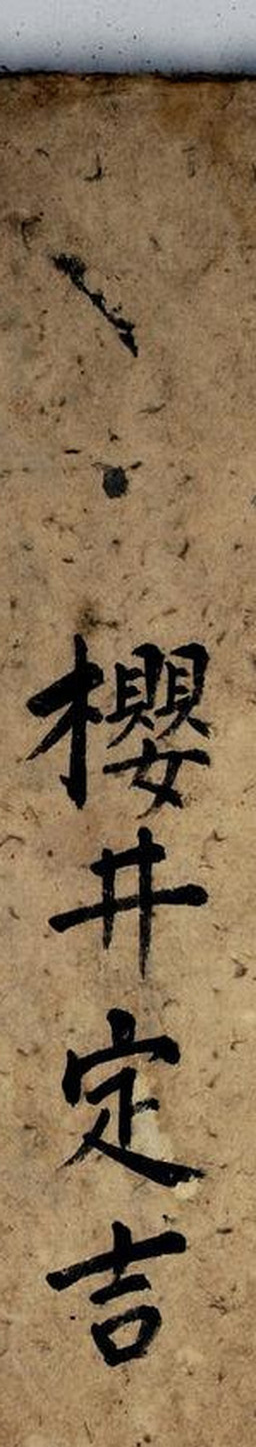桜井定吉
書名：世話千字文（手習手本）
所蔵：福井県文書館 Fukui Prefectural Archives
